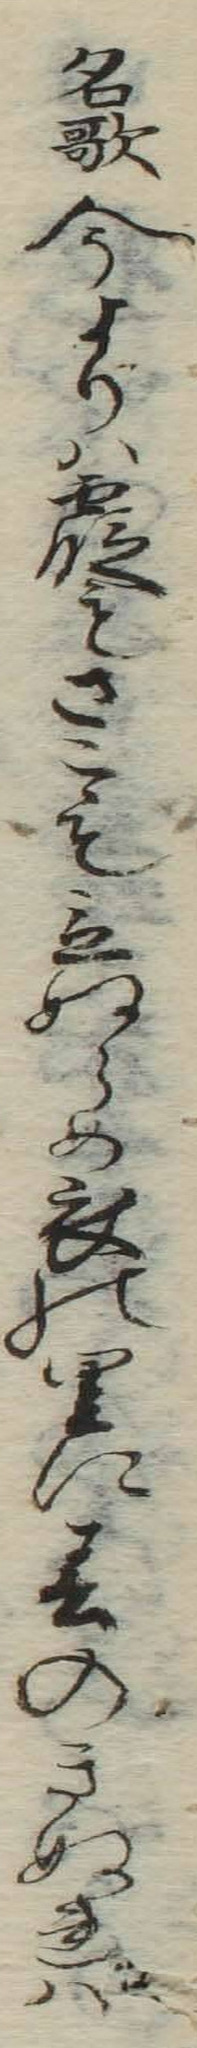名歌今よりは霞もさこそ立ぬらめ衣の里に春のきぬれば
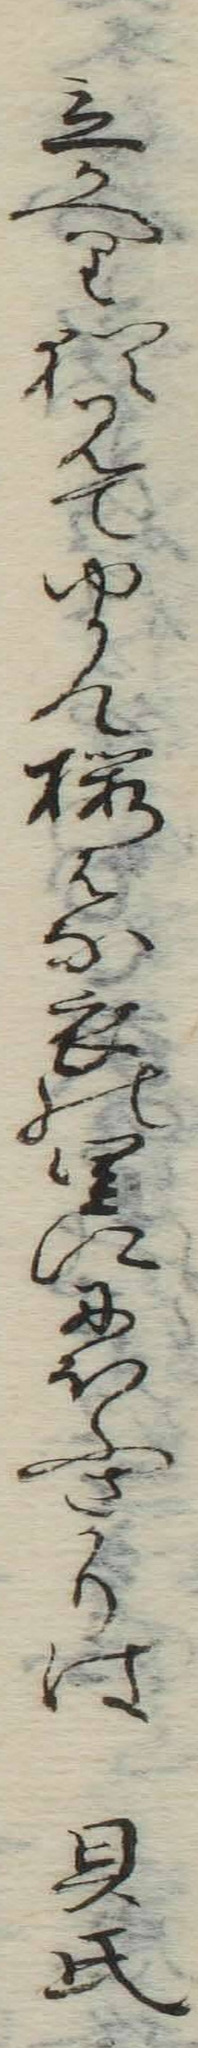同立かへり猶見てゆかん桜はな衣の里ににほふさかりは具氏
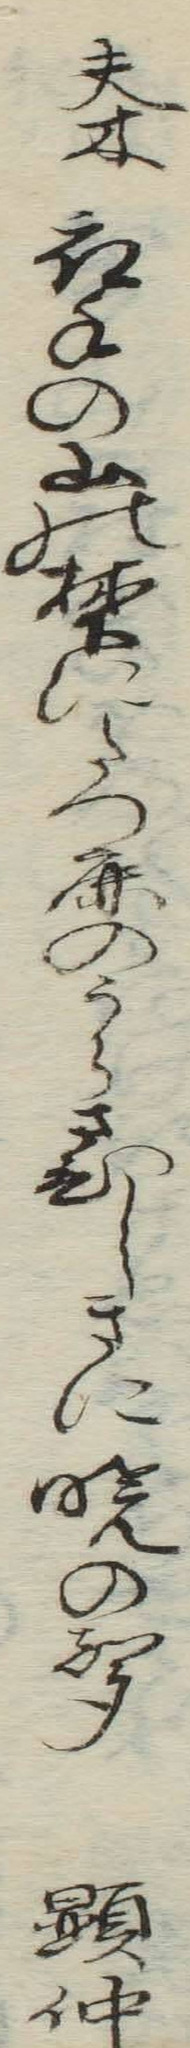夫木衣手の山の梺にたつ鹿のうらさひしきに暁の声顕仲
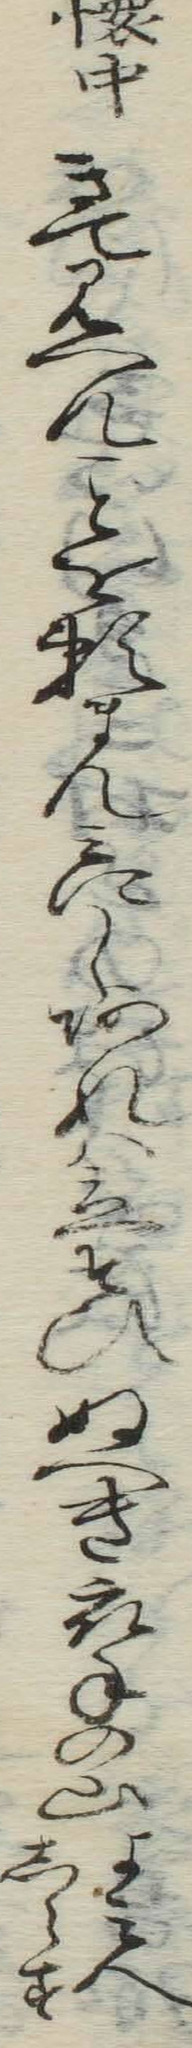懐中きて見へんことを頼まんみにしあれは立そひぬへき衣手の山よみ人しらす
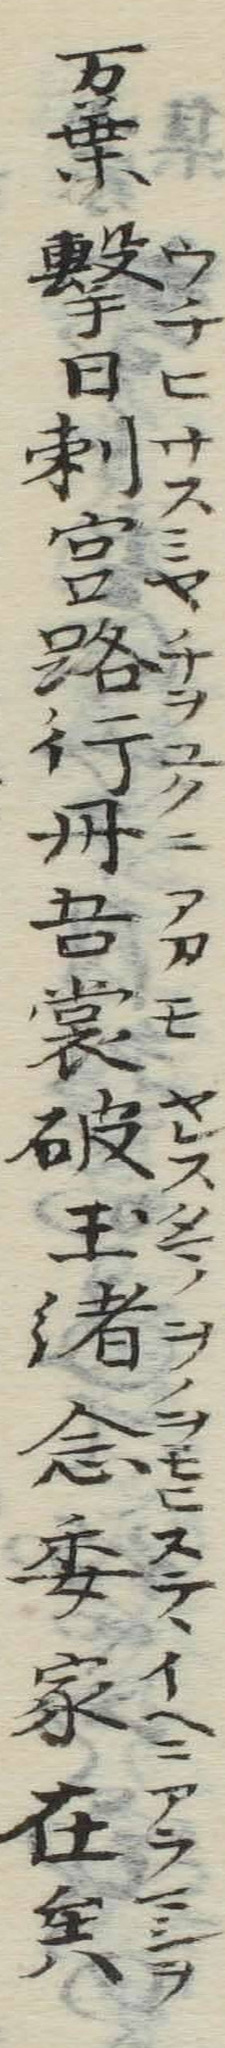万葉撃日刺宮路行丹吾裳破玉緒念委家在矣
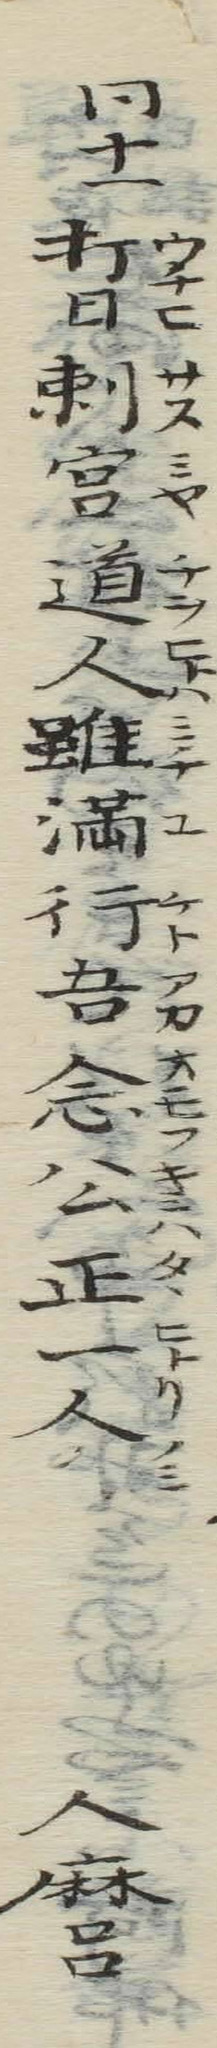同十一打日刺宮道人雖満行吾念公正一人
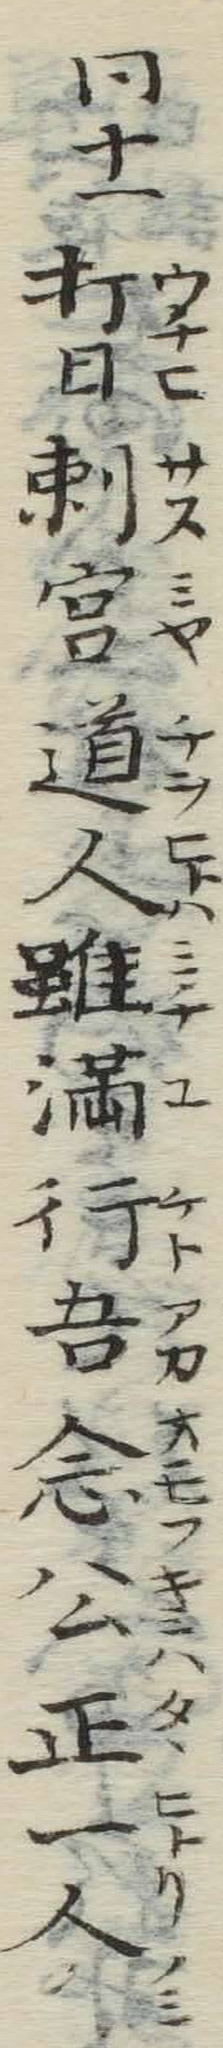同十一打日刺宮道人雖満行吾念公正一人
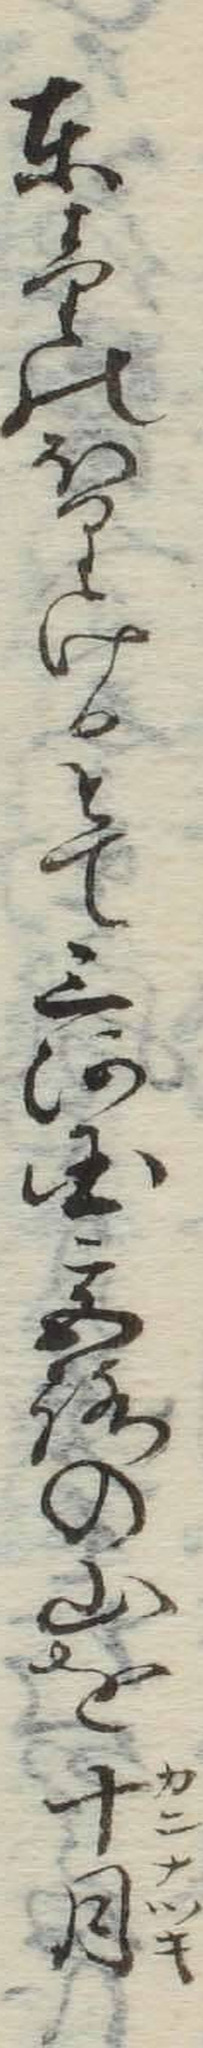東よりのほりけるとて三河国宮路の山を十月
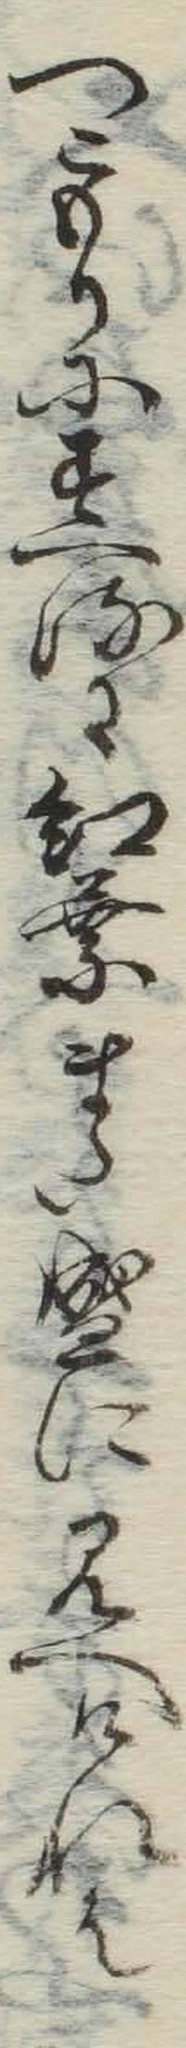つこもりにすくるに紅葉また盛に見へけれは
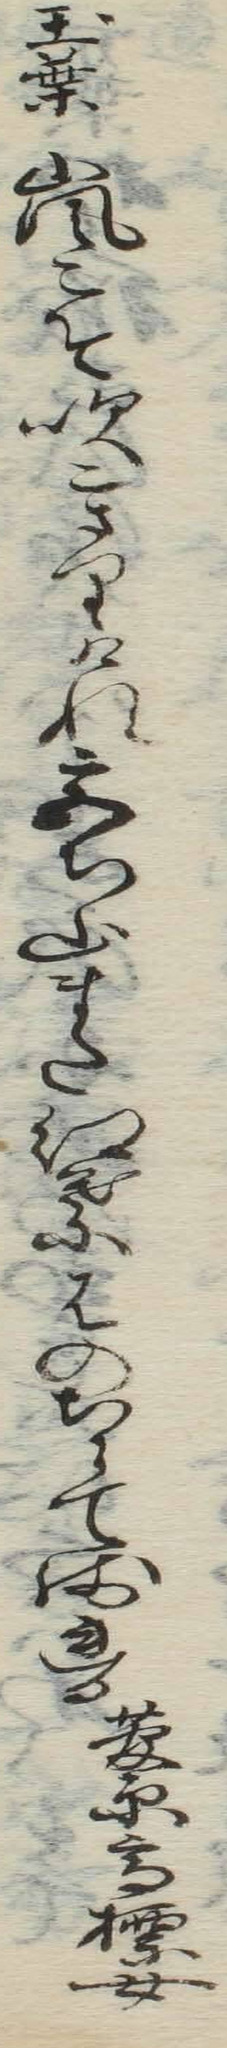玉葉嵐こそ吹こまりけれ宮ち山また紅葉はのちらて残れる藤原高標女
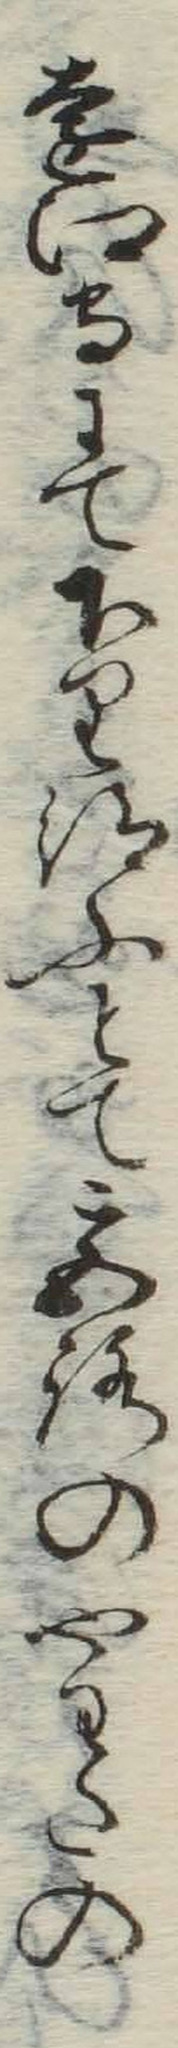遠江守にて下り給ふとて宮路のやまたの
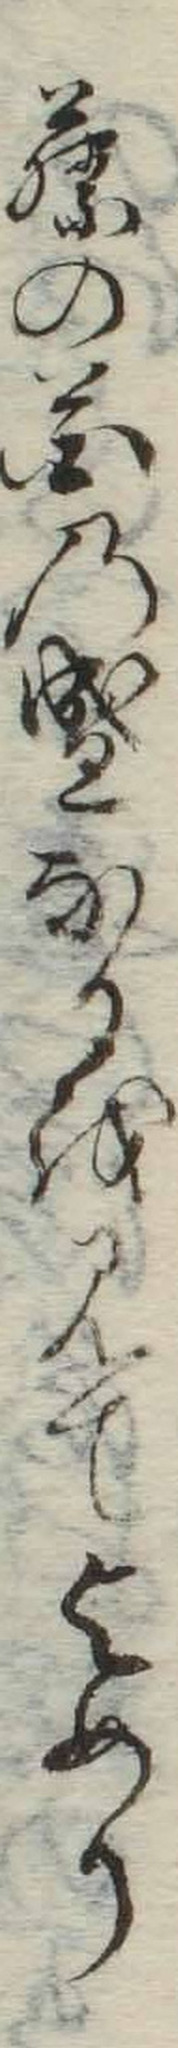藤の花の盛なるを見てよめり
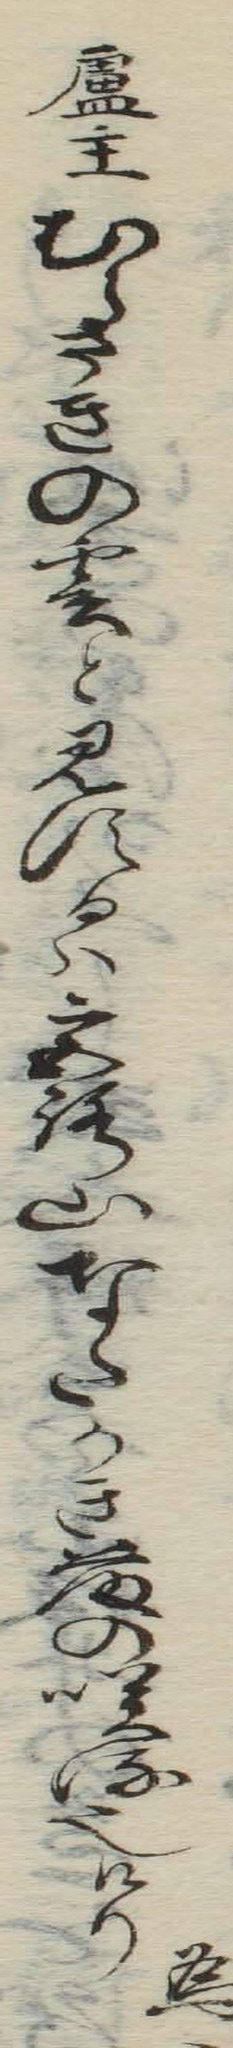盧主むらさきの雲と見するは宮路山なたかき藤の咲る也けり為家
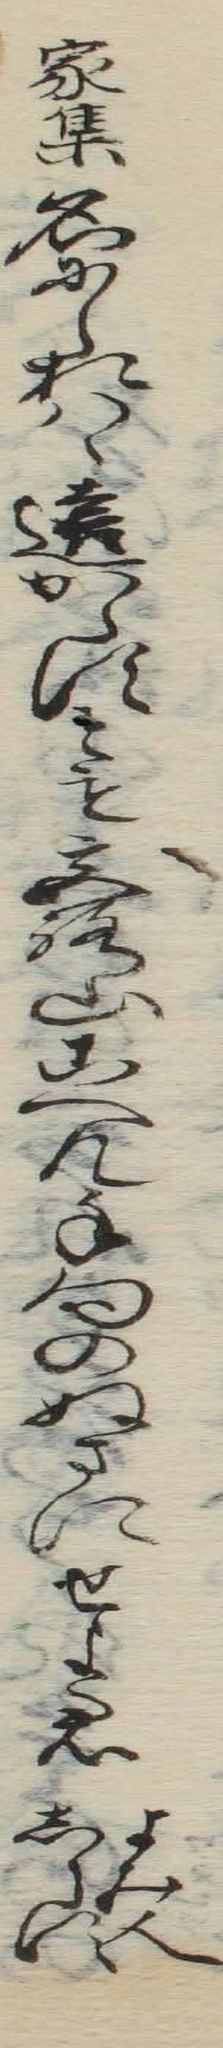家集名にしおはゝ遠からすしも宮路山こへん手向のぬさせよ君よみ人しらす
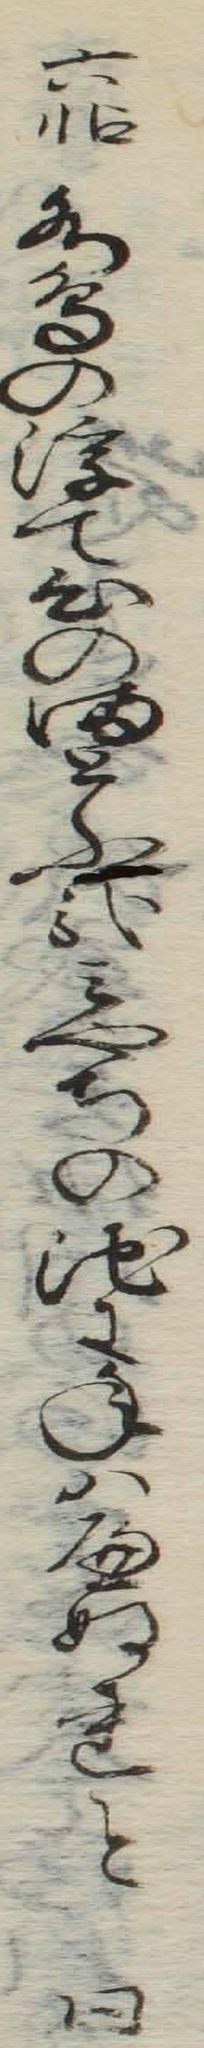六帖水鳥の浮て心のまとふ哉みやちの池に年はへぬれと同
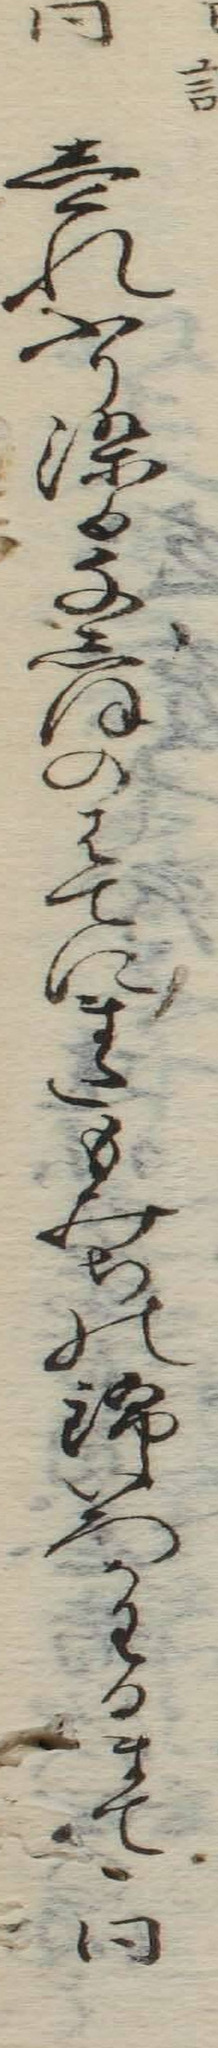同しくれふり染るちしほのはてにまたもみちの錦いろかわるまて同
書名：三河国二葉松
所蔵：国文学研究資料館
